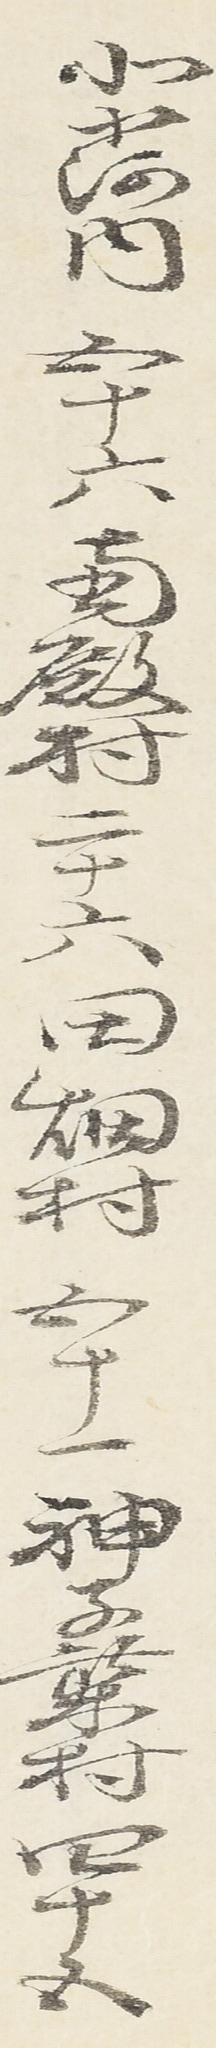北小河内五十六南殿村二十六田畑村五十一神子柴村四十五
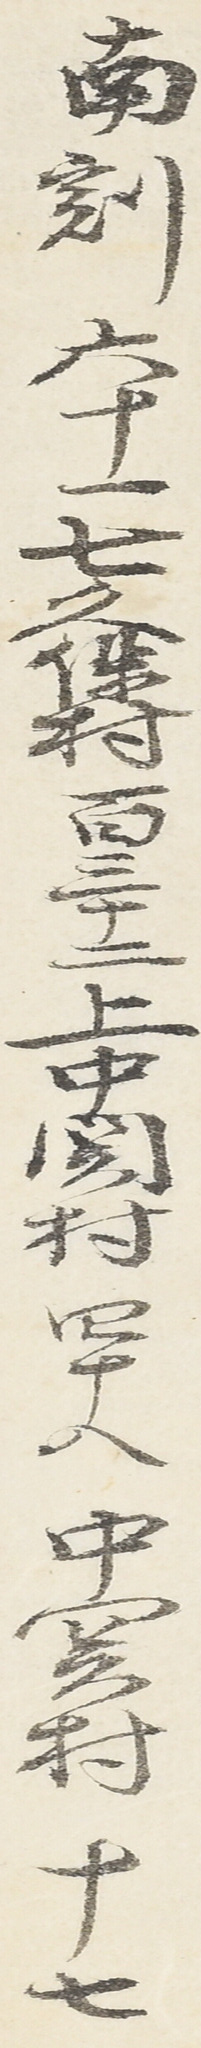南割六十一七久保村百三十二上中関村四十八中関村十七
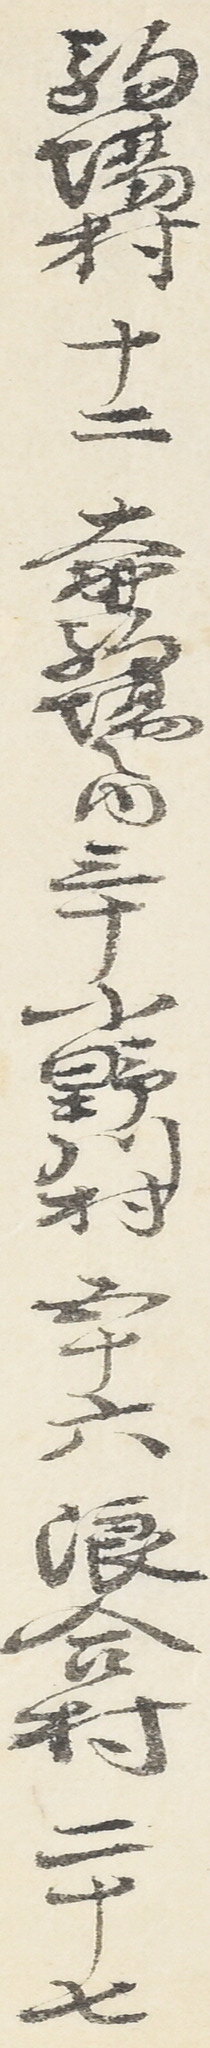駒場村十二大野駒場之内三十小野川村五十六浪合村二十七
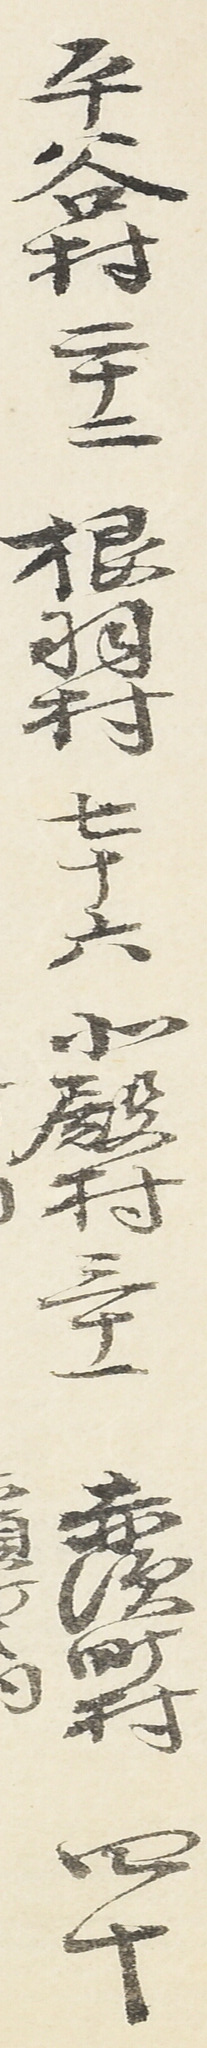平谷村二十二根羽村七十六北殿村三十一赤次町村四十
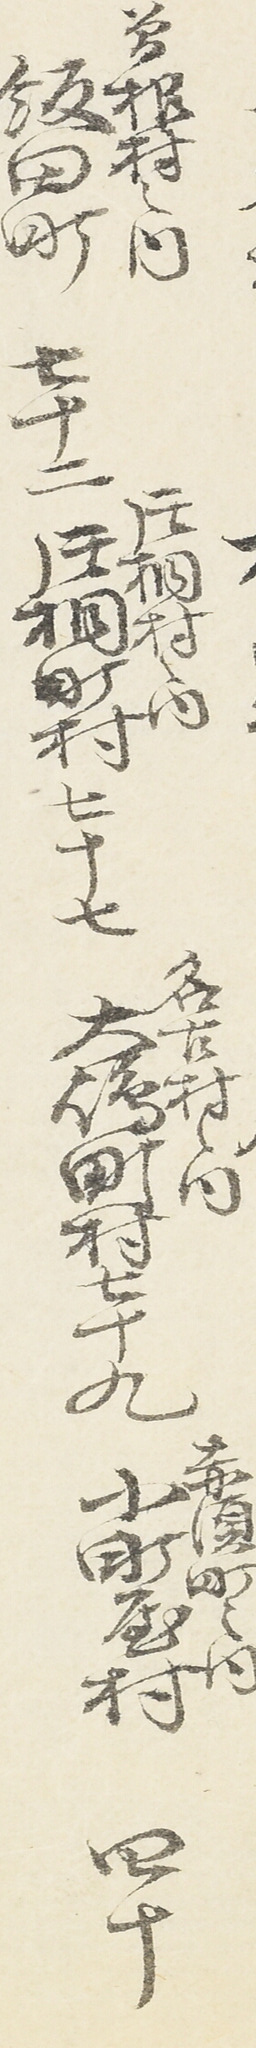北河原村十四片桐町村七十七大嶋町村七十九小屋村四十
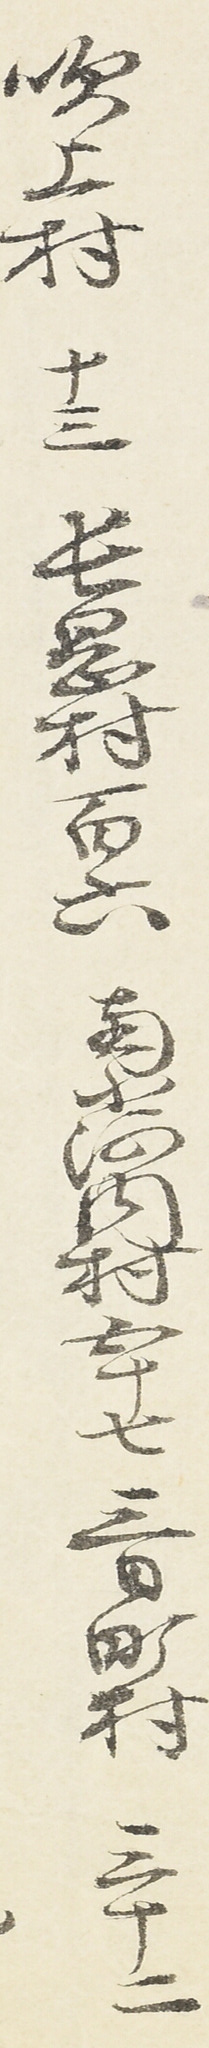吹上村十三長岡村百六南小河内村五十七三日町村三十二
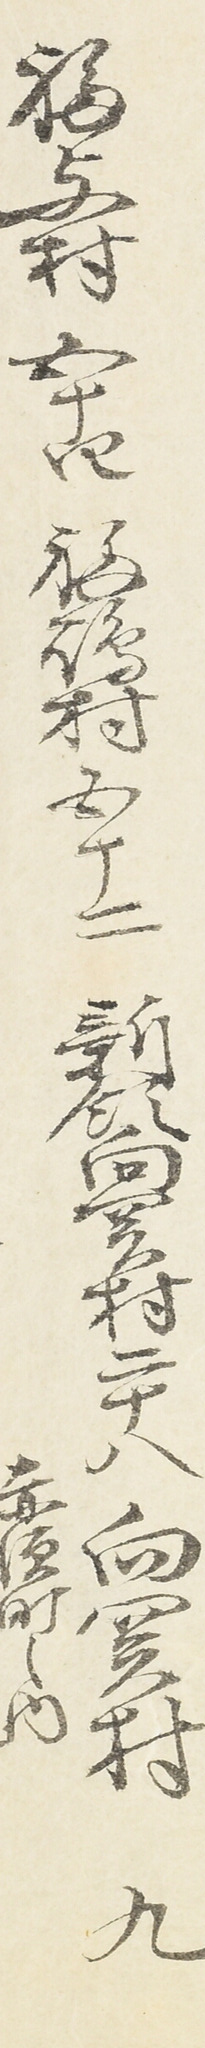福与村五十四福嶋村五十二新領向関村二十八向関村九
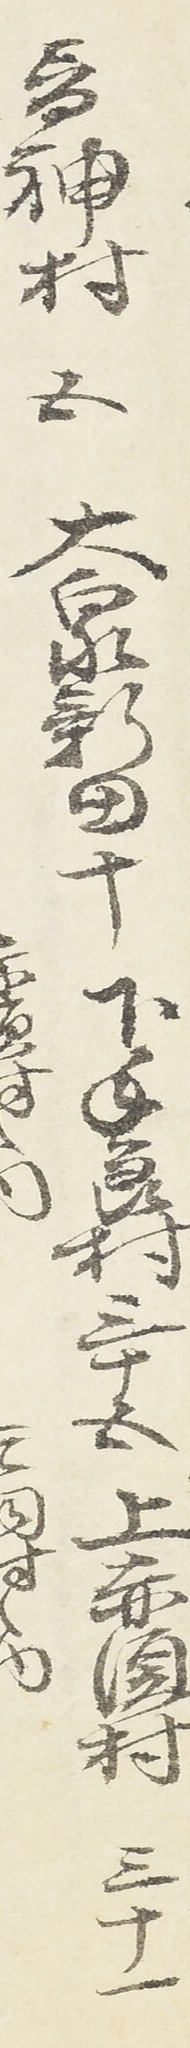神村五大泉新田十下手良村三十五上赤須村三十一
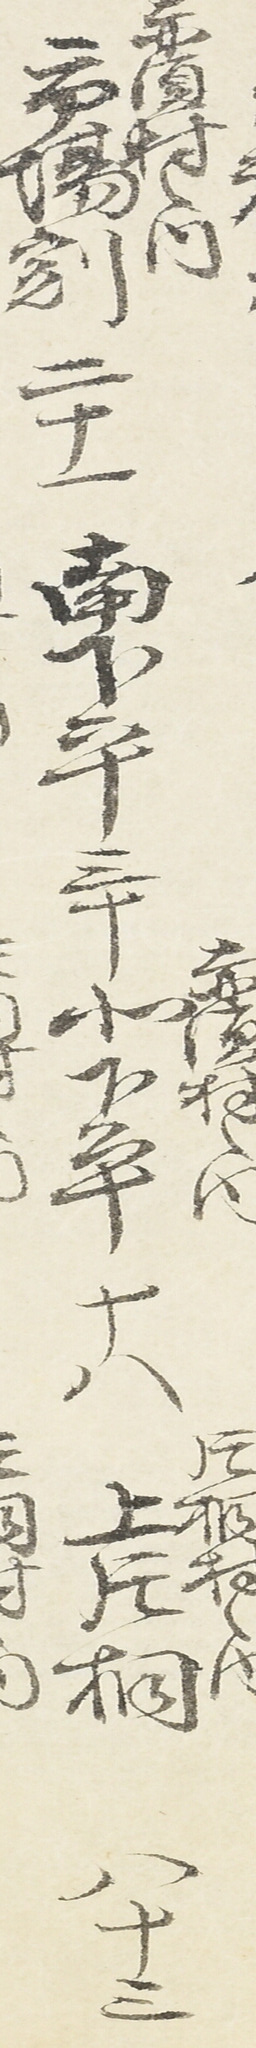市場割二十一南下平三十北下平十八上片桐八十三
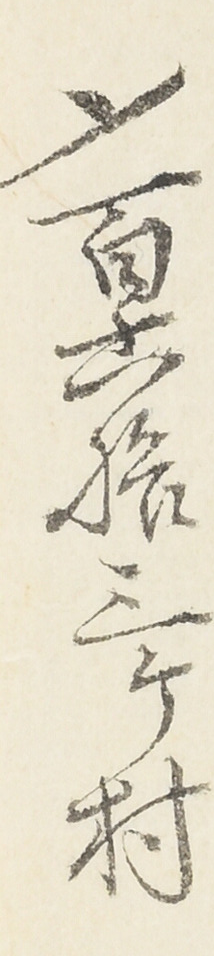〆百六拾三ヶ村

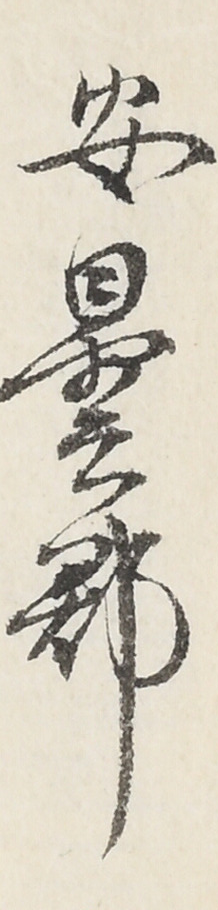安曇郡
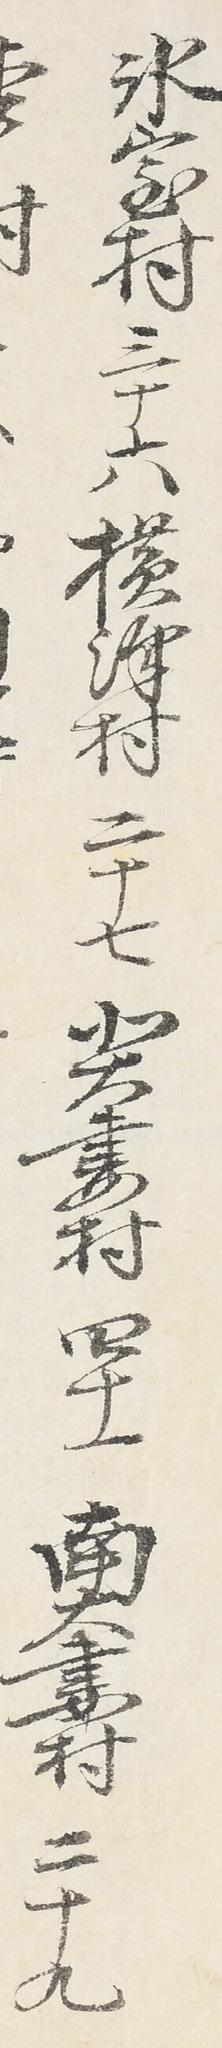氷室村三十六横沢村二十七北大妻村四十一南大妻村二十九
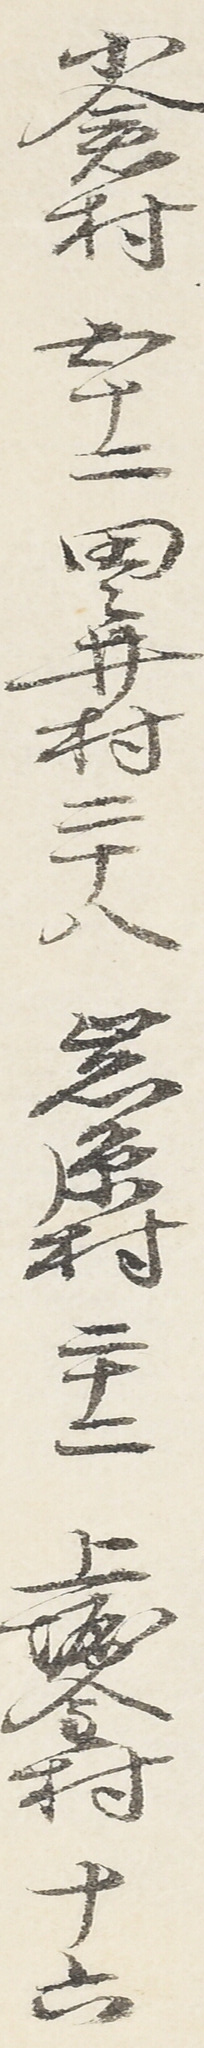小倉村五十二田之井村二十八岩原村二十二上堀金村十六
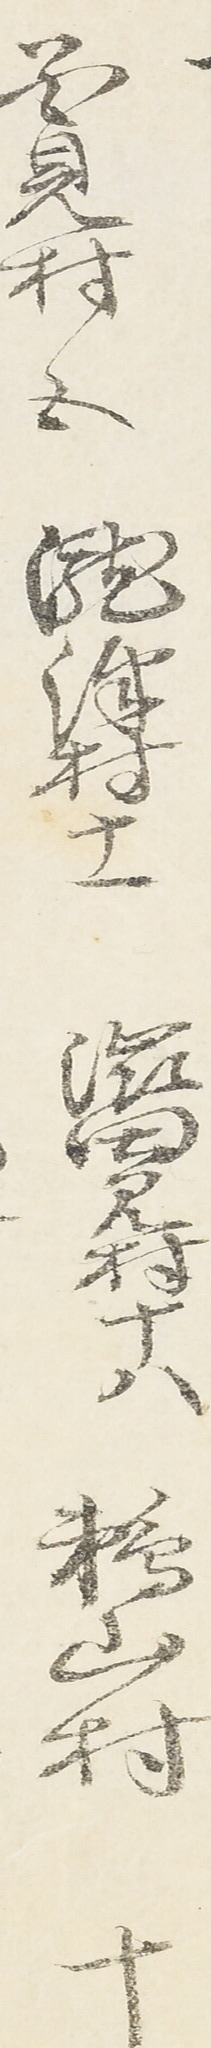国見村五瀧沢村十一渋田見村十鵜山村十

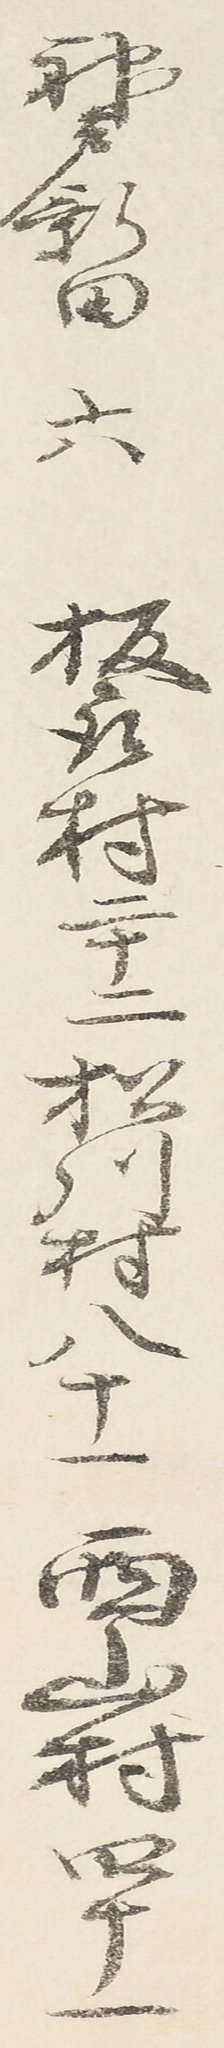神戸新田六板取村二十二松川村八十一西山村四十一
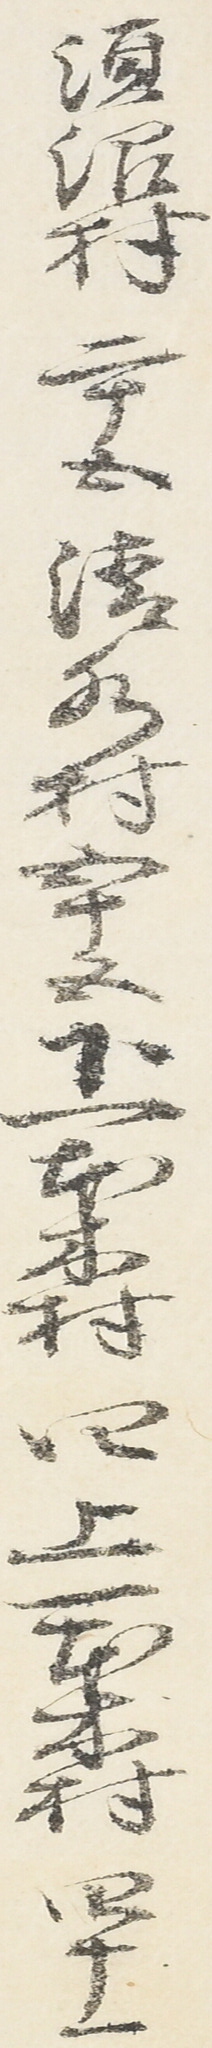須沼村二十五清水村五十五下一本木村四上一本木村四十一
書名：中馬御裁許帳面
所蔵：伊那市立高遠町図書館・合同会社AMANE
